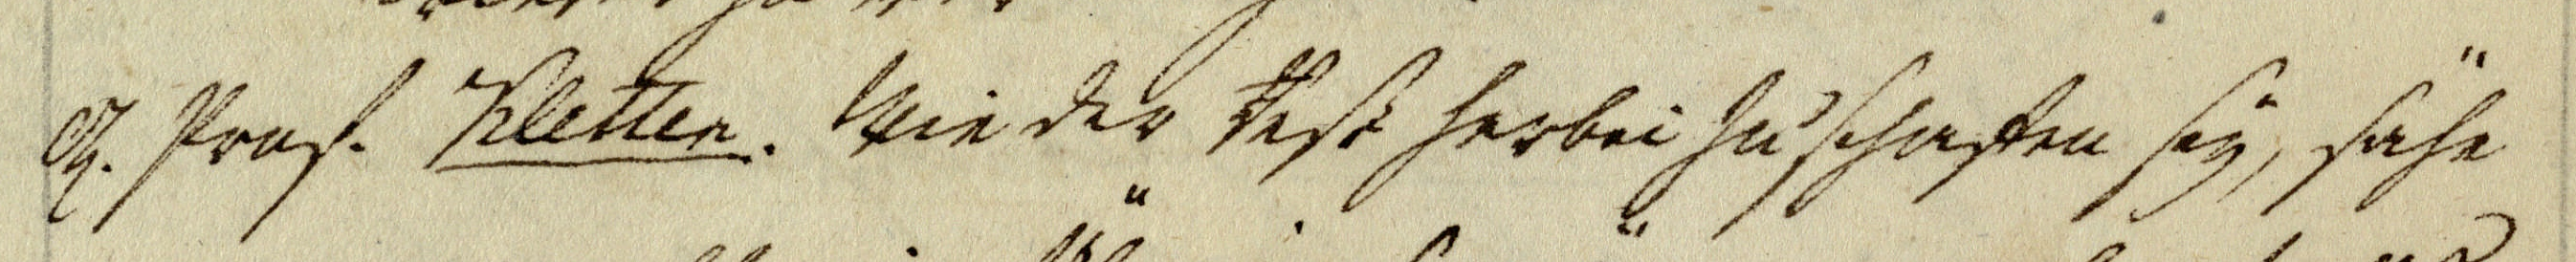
dh. Prof. Kletten. Wie der Rest herbei zuschafen seÿ, sähe
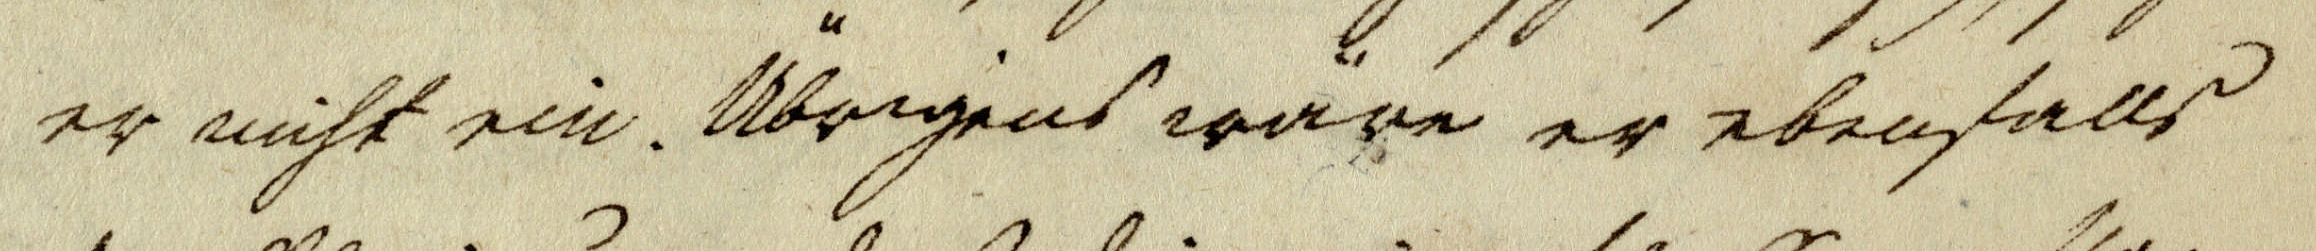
er nicht ein. Übrigens wäre er ebenfalls
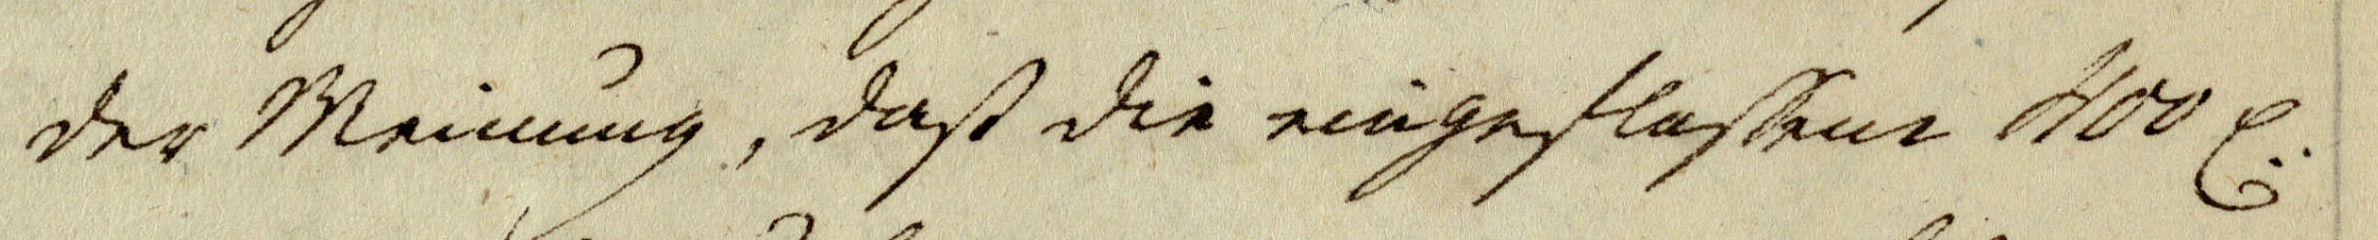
der Meinung, daß die eingeflossene 400 l.
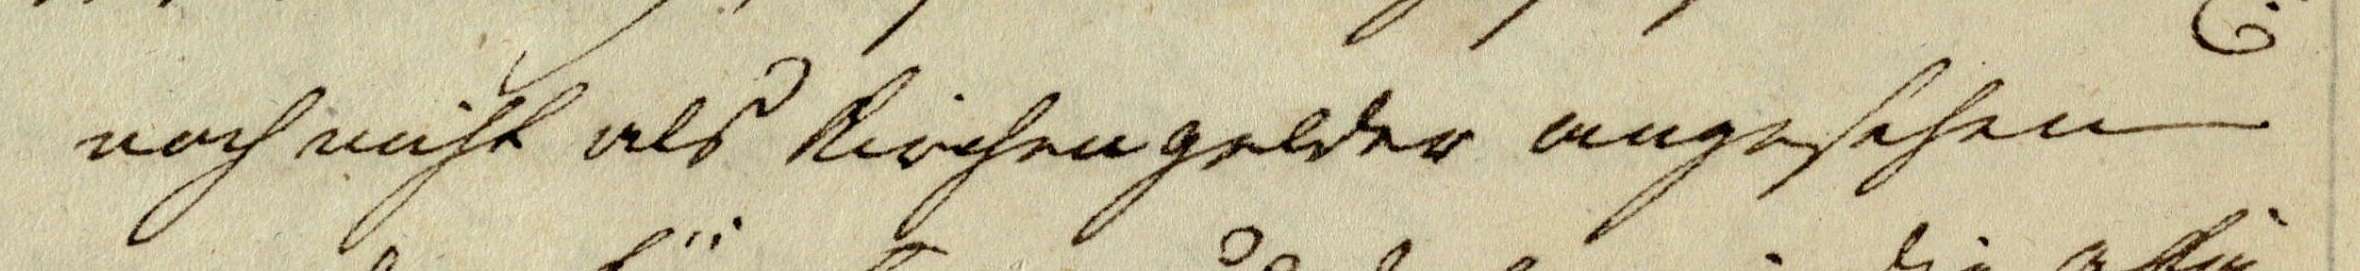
noch nicht als Kirchengelder angesehen
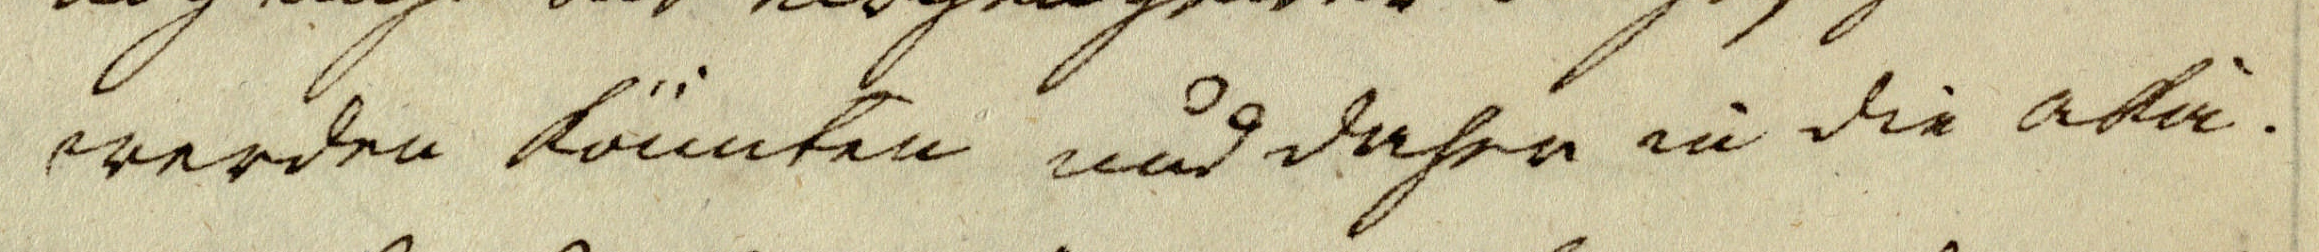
werden könnten und daher in die aka¬
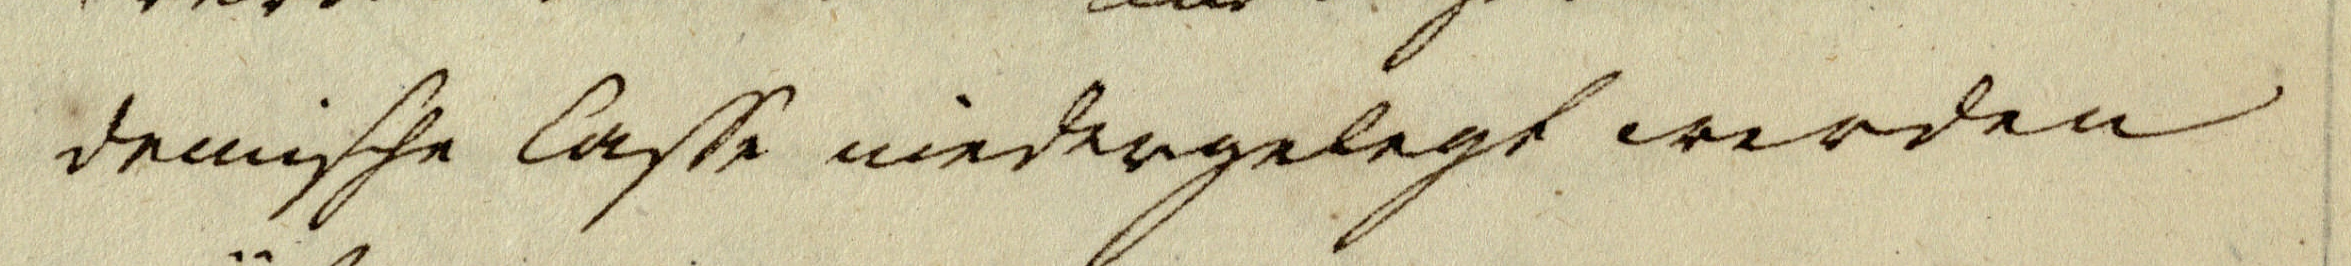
demische Casse niedergelegt werden
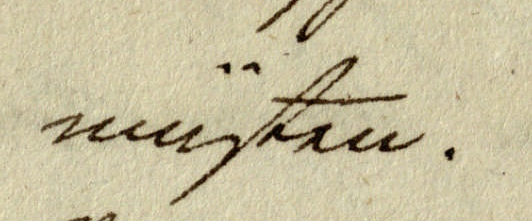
müßten.
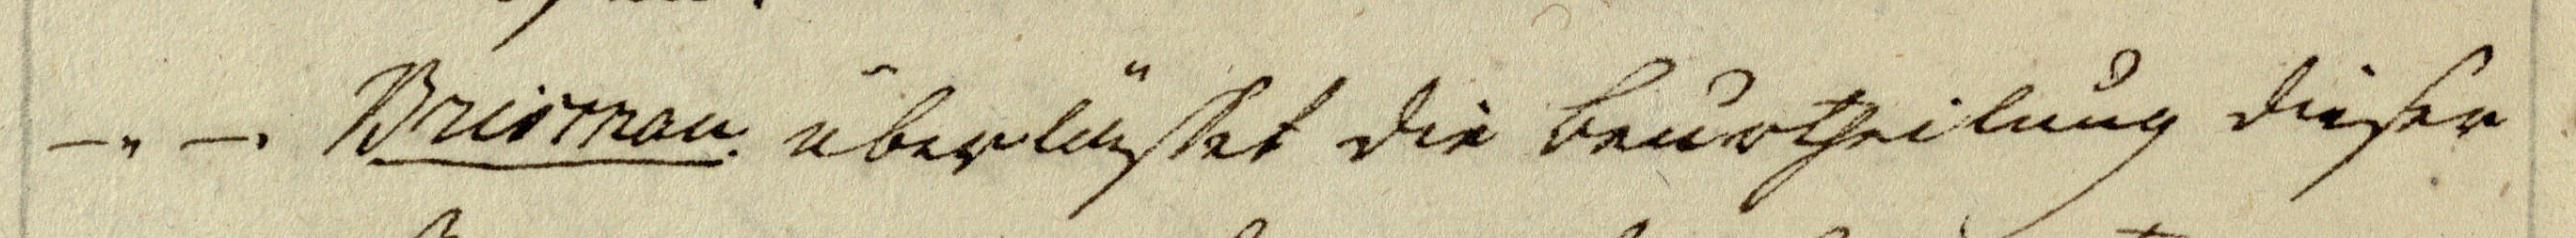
Brisman überlässet die Beurtheilung dieser
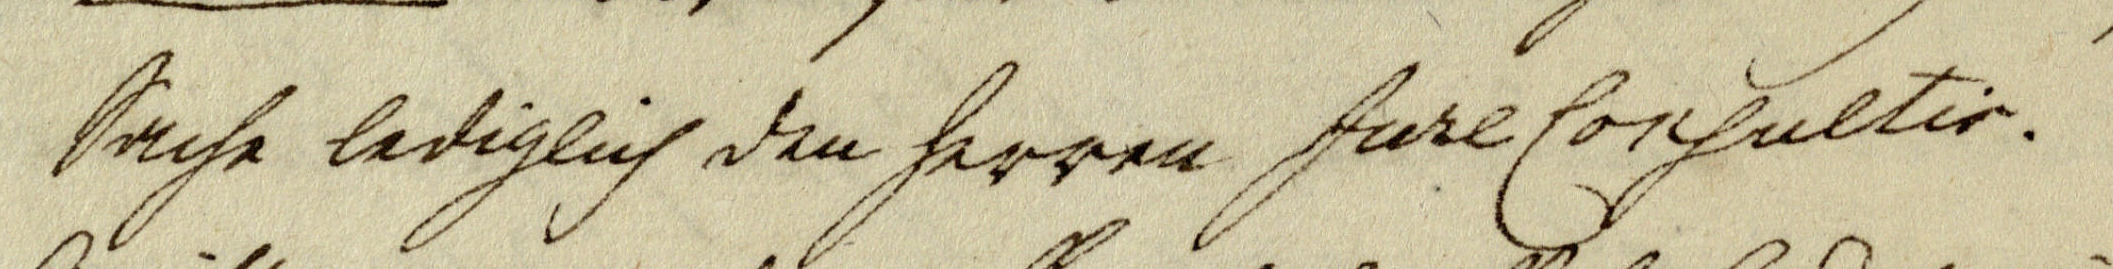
Sache lediglich den Herren Jure Consultis.
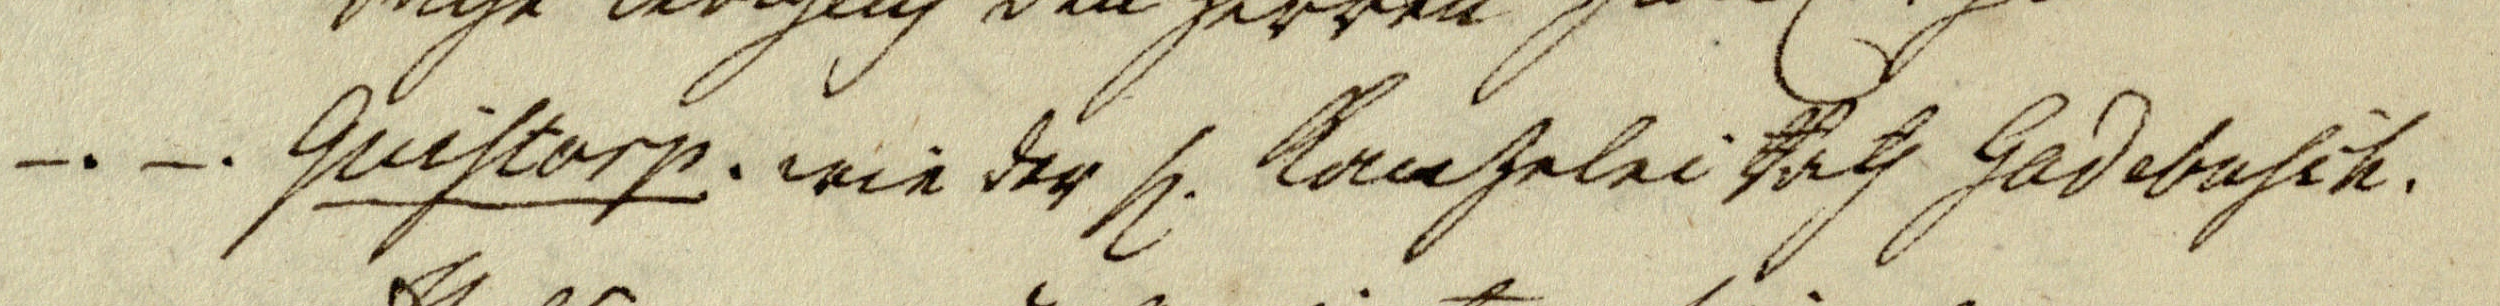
Quistorp. wie der h. Kanzelei Rath Gadebusch.
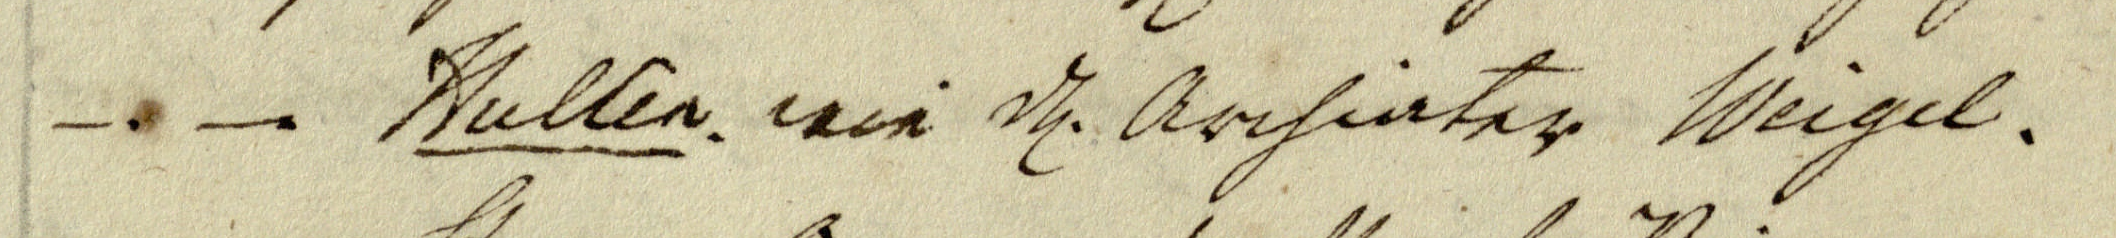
Hultén. wie dh. Archiater Weigel.
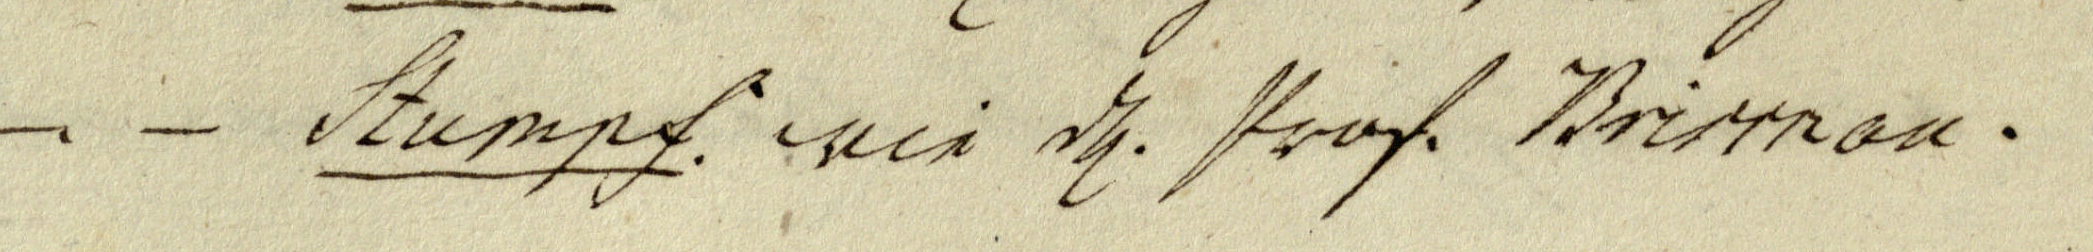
Stumpf. wie dh. Prof. Brisman.
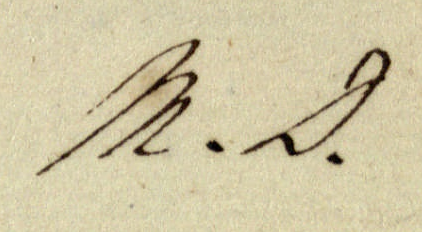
M. D.
